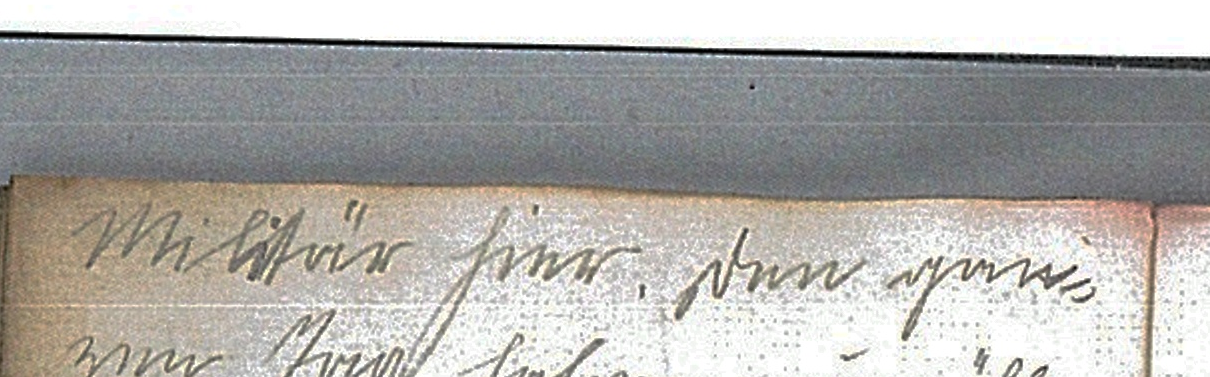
Militär hier. Den gan0
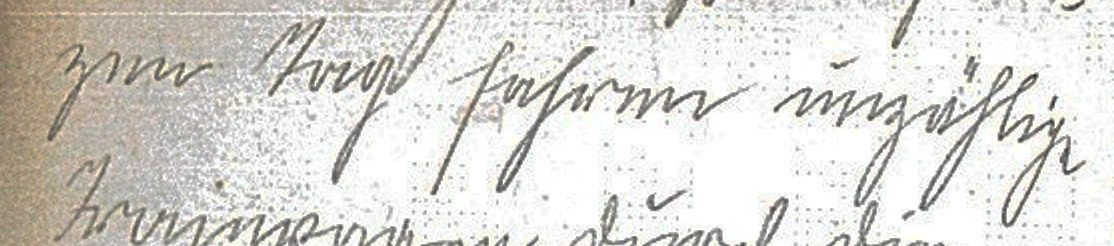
zen Tag fahren unzählige
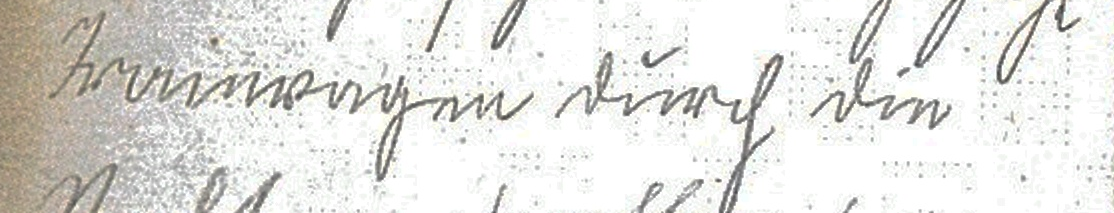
Trainwagen durch die
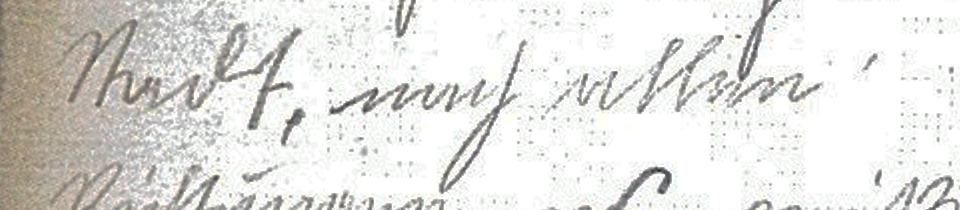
Stadt, aus allen
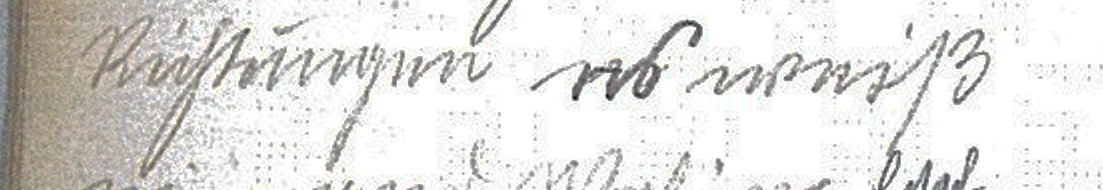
Richtungen es weiß
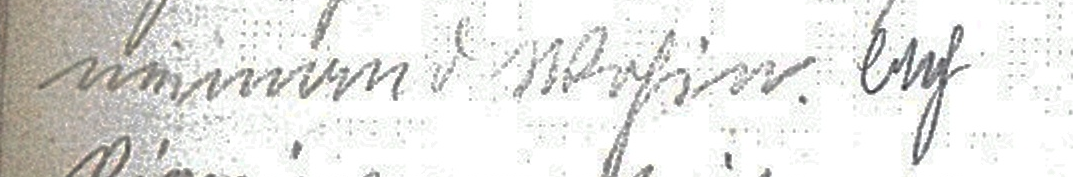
niemand Wohin. Auch
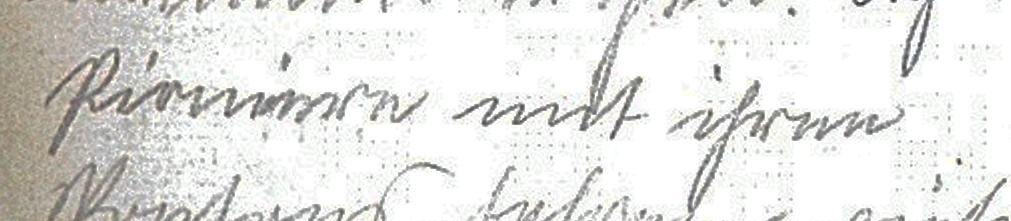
Pioinere mit ihren
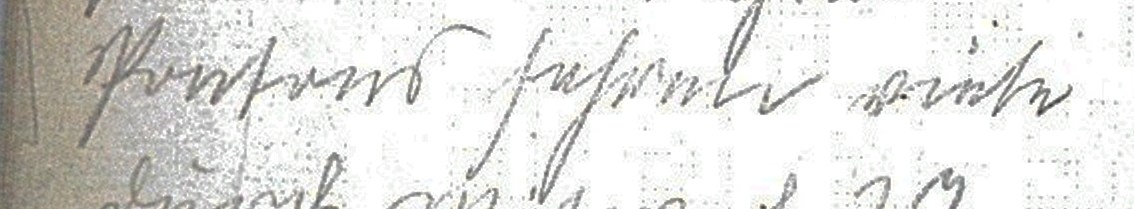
Pontons fuhren viele
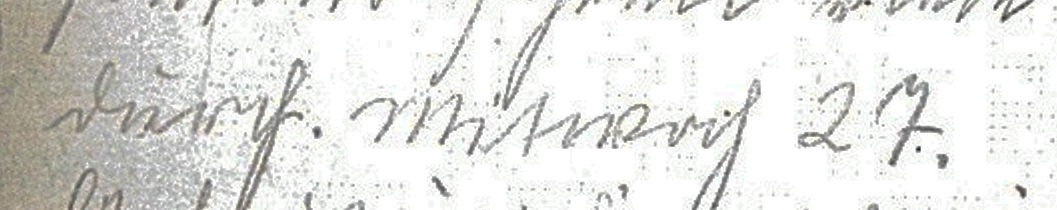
durch. Mittwoch 27.
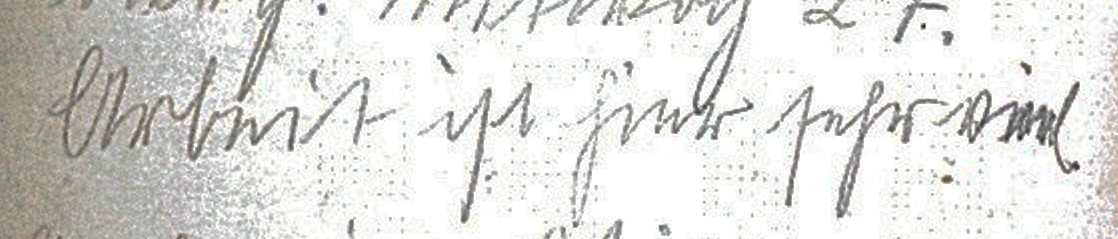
Arbeit ist hier sehr viel
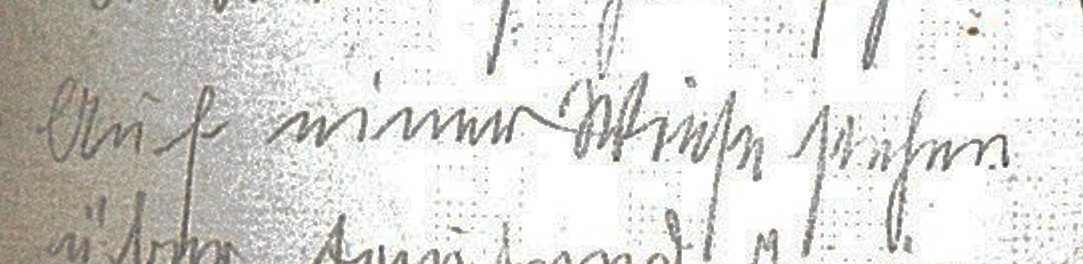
Auf einer Wiese stehen
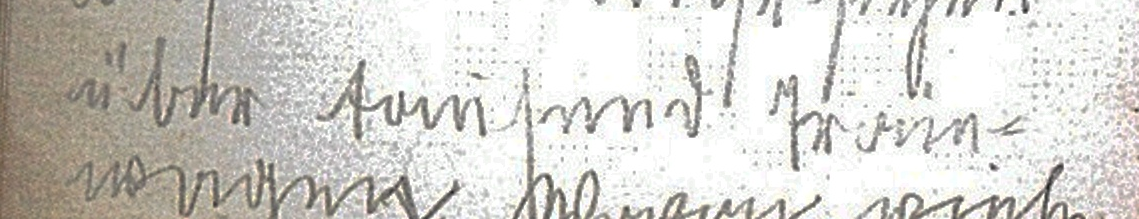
über tausend Train-
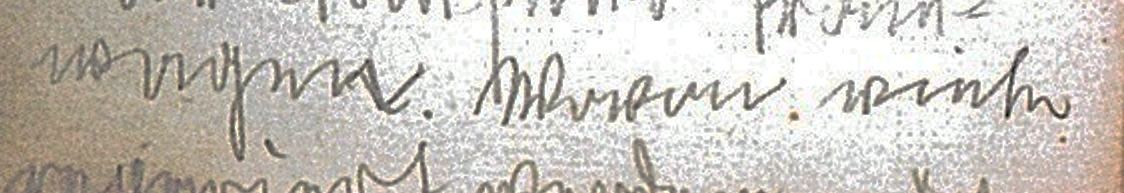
wagen. Wovon viele
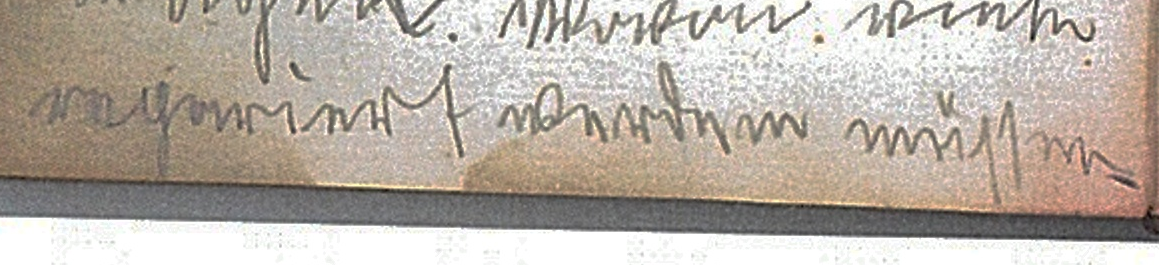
wagoniert werden müssen
